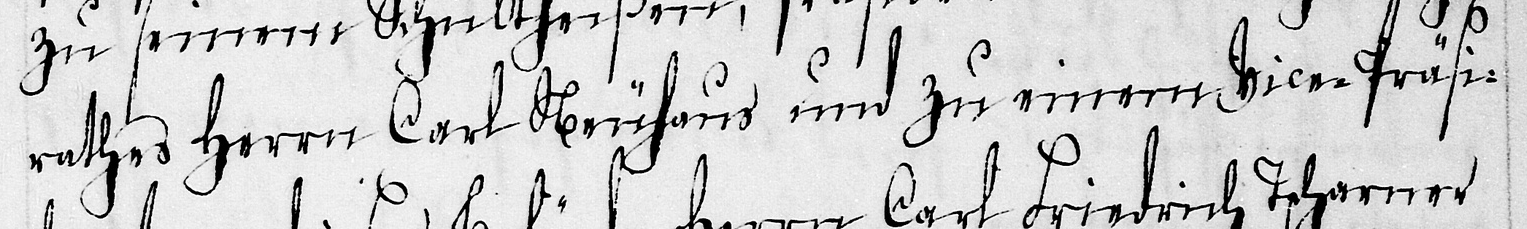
rathes Herrn Carl Neuhaus und zu einem Vice-Präsi¬
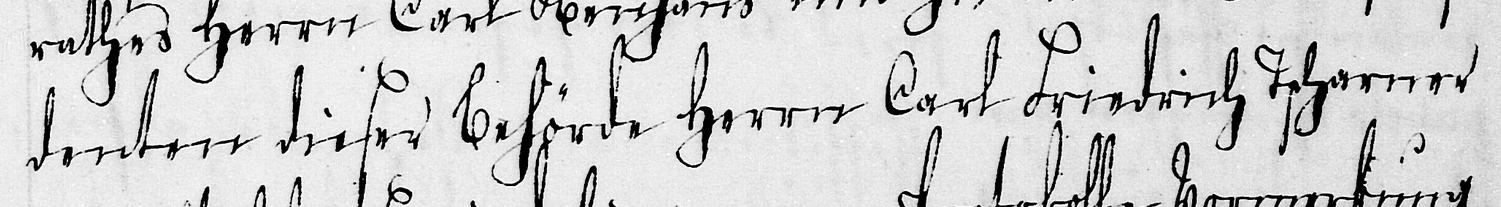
denten dieser Behörde Herrn Carl Friedrich Tscharner
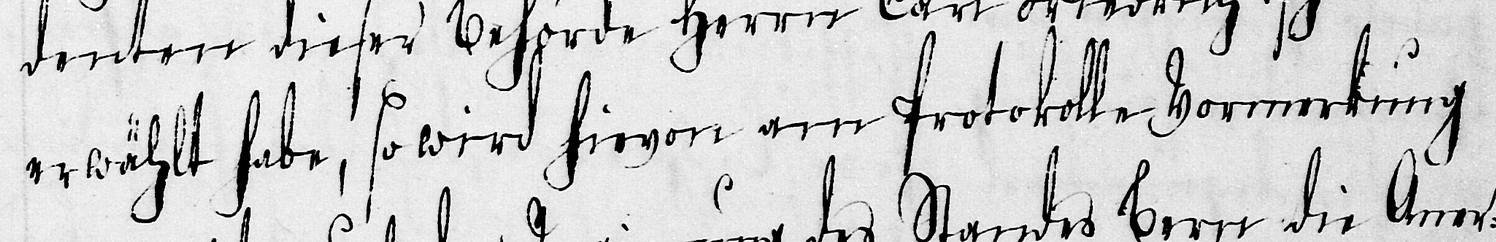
erwählt habe, so wird hievon am Protokolle Vormerkung
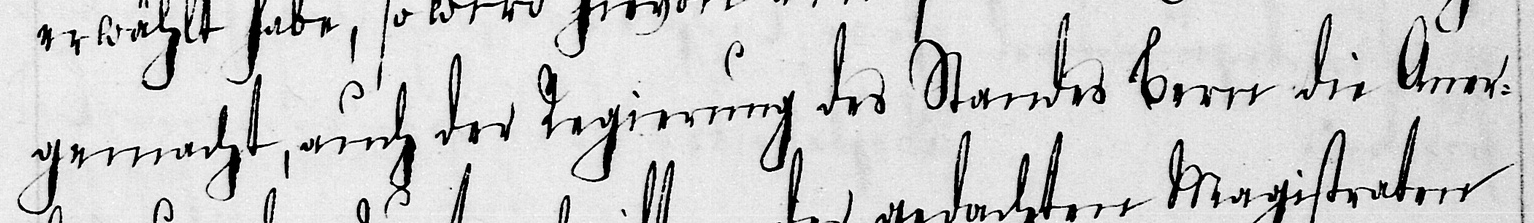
gemacht, auch der Regierung des Standes Bern die Aner¬
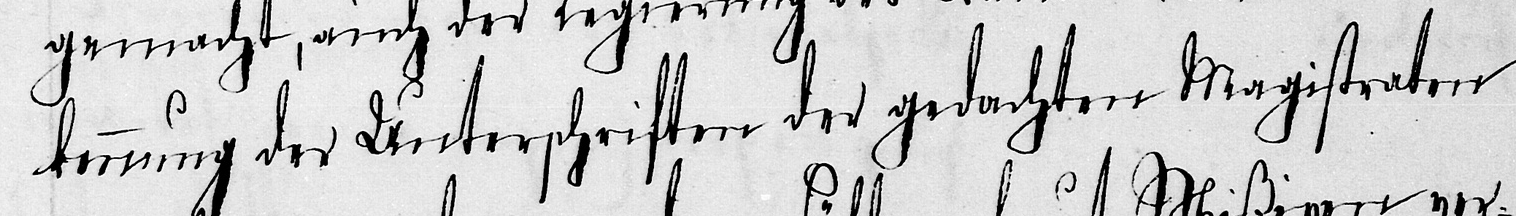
kennung der Unterschriften der gedachten Magistraten
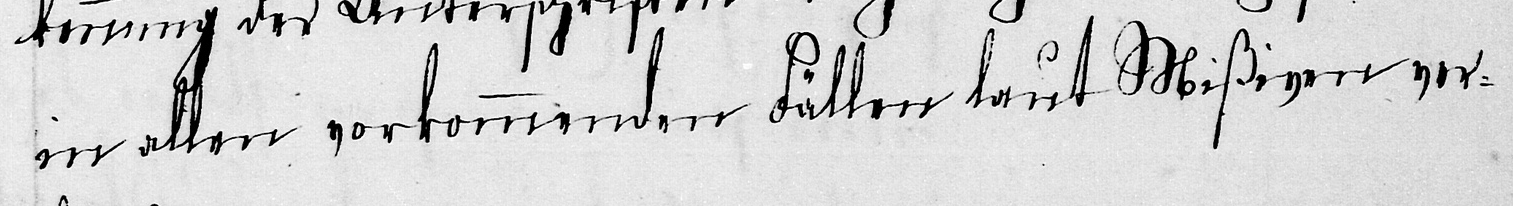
in allen vorkommenden Fällen laut Mißiven ver¬
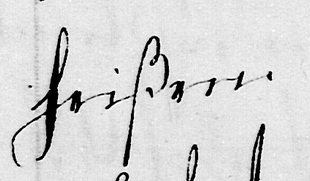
heißen.
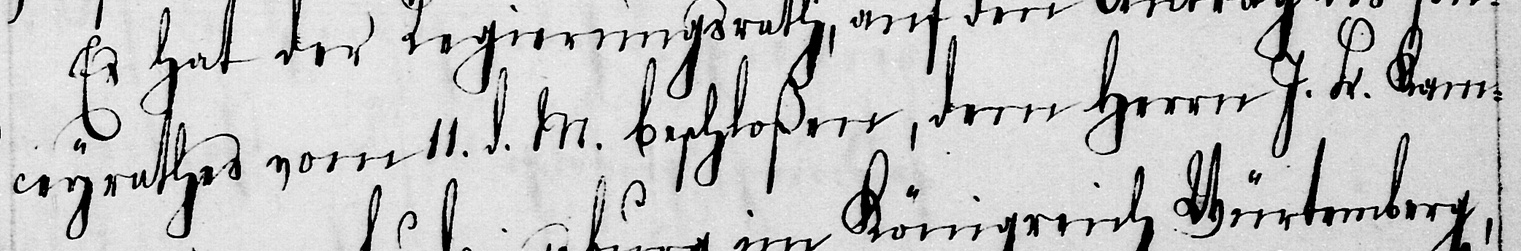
ceyrathes vom 11. d. M. beschloßen, dem Herrn J. Fr. Kam¬
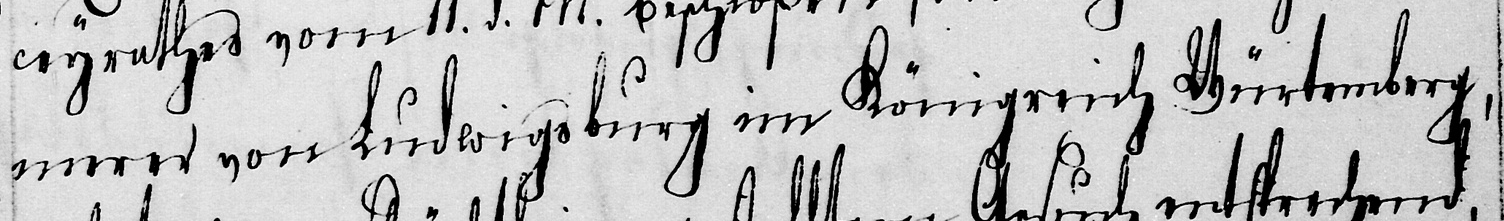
merer von Ludwigsburg im Königreich Würtemberg,
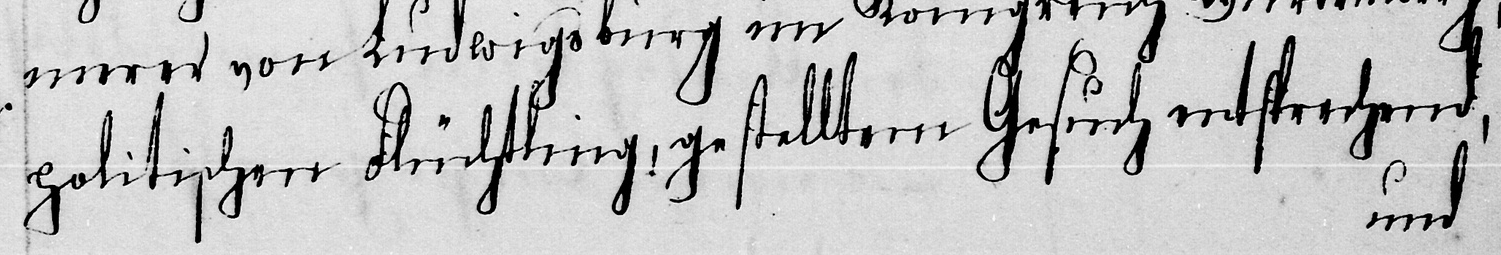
politischen Flüchtling, gestelltem Gesuch entsprechend,
